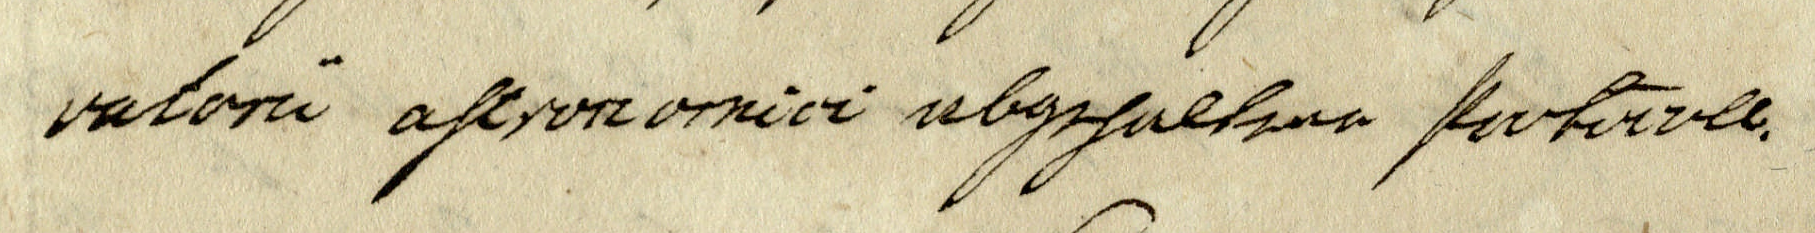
vatorii astronomici abgehaltene Protocoll.
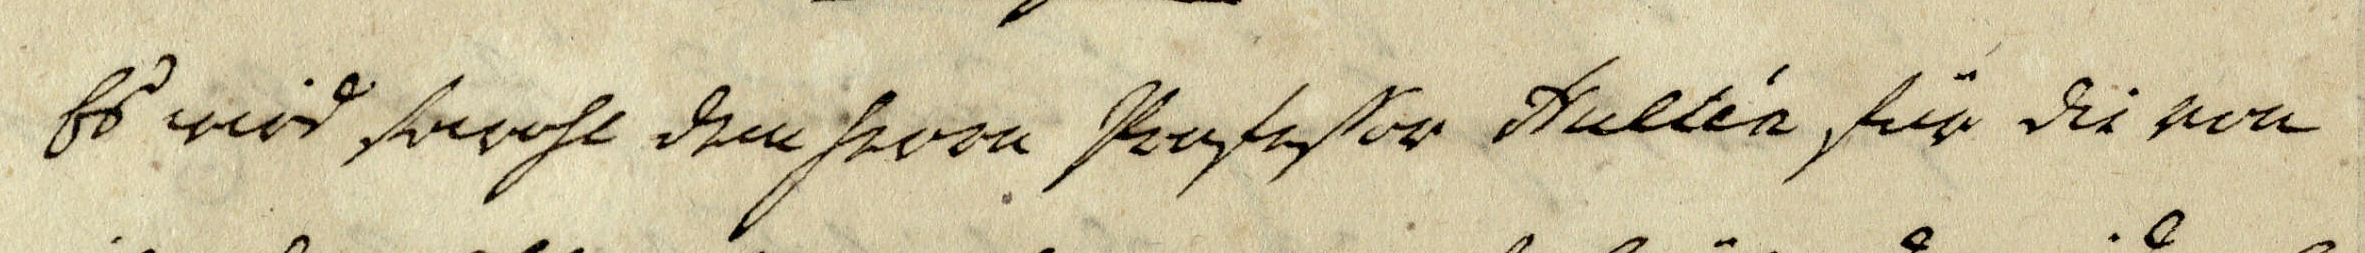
Es wird sowohl dem Herrn Professor Hultén für die von
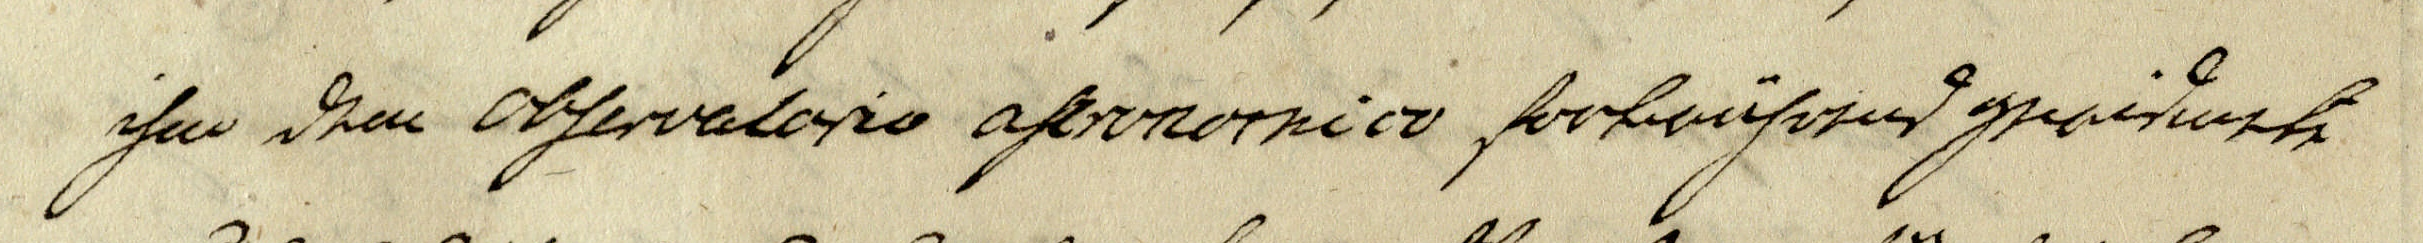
ihm dem Observatorio astronomico fortwährend gewidmete
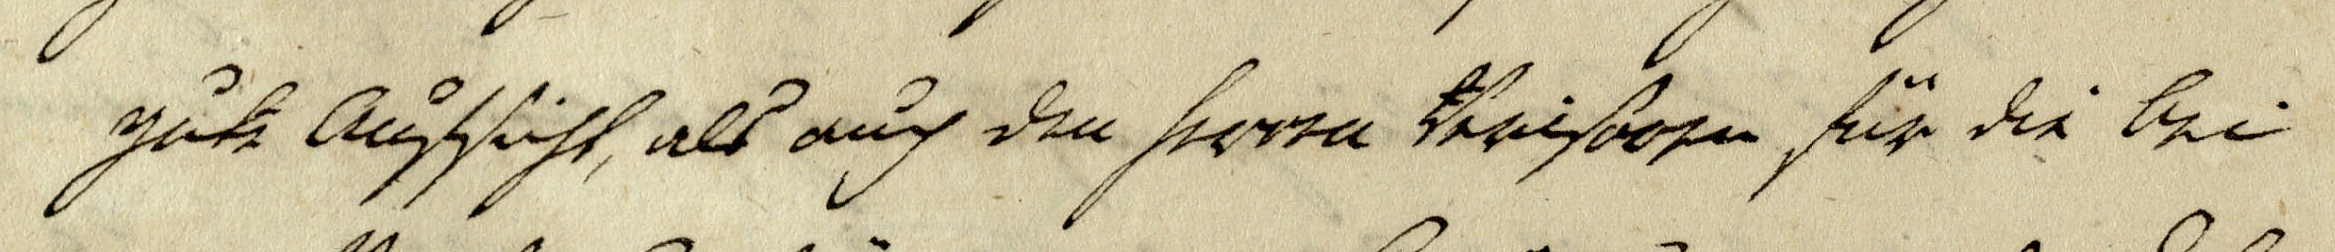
gute Aufsicht, als auch den Herren Revisoren für die bei
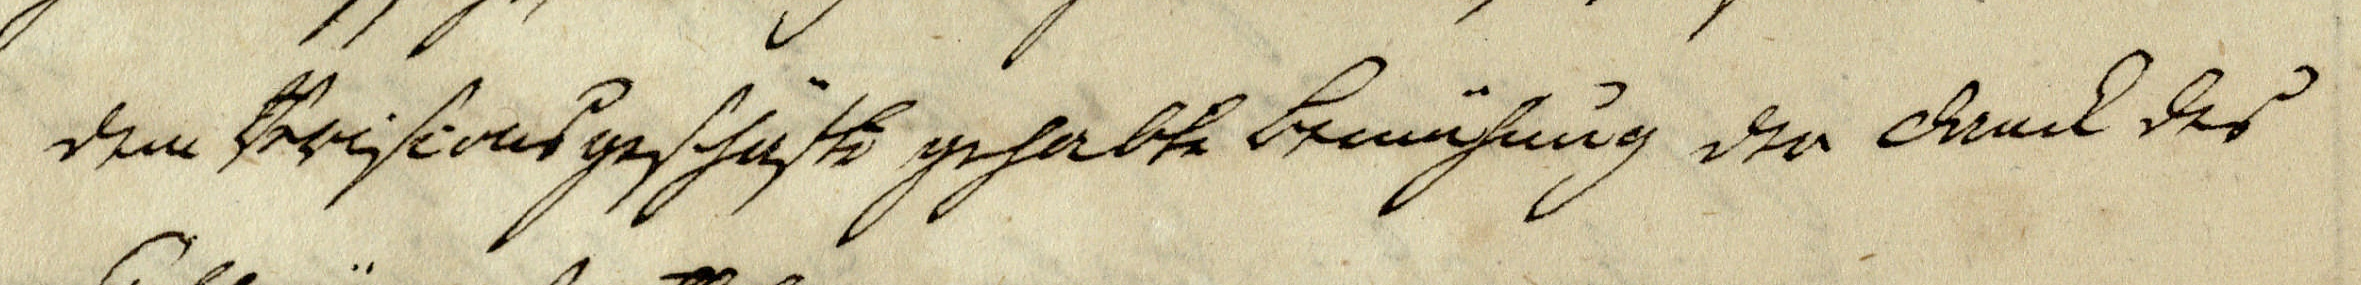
dem Revisionsgeschäfte gehabte Bemühung der Danck des
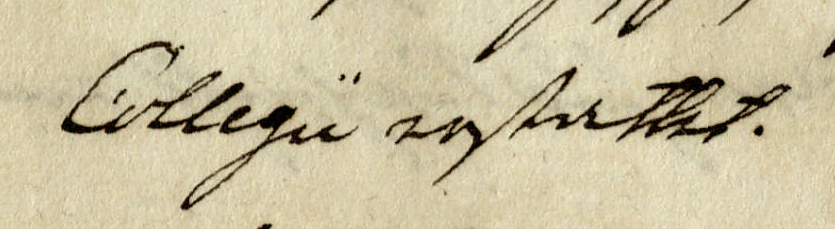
Collegii erstattet.
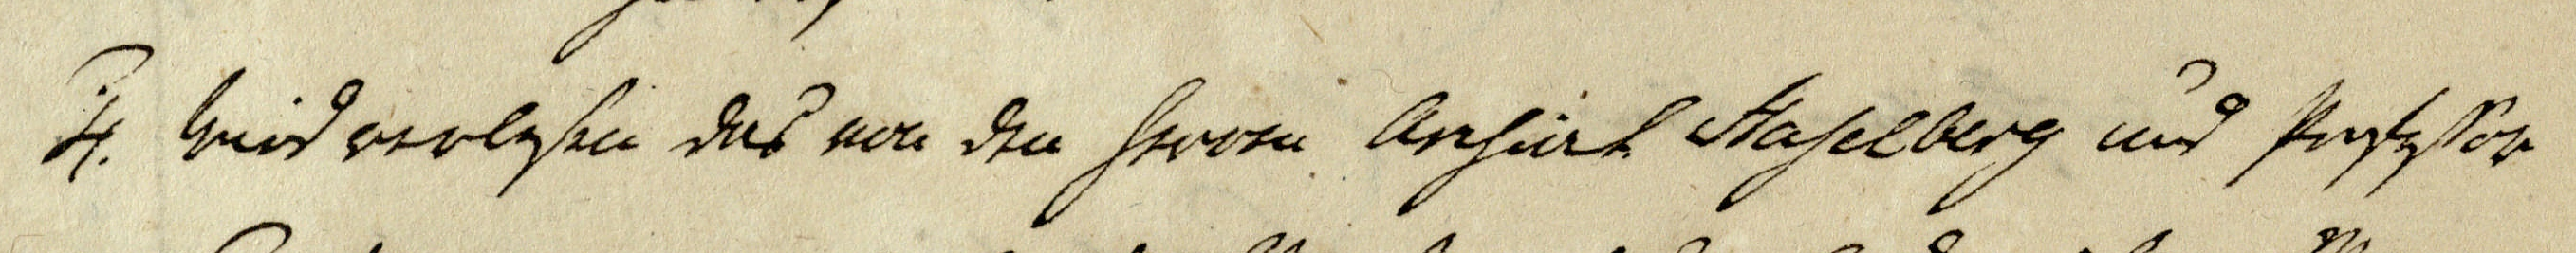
4. Wird verlesen das von den Herren Archiat. Haselberg und Professor
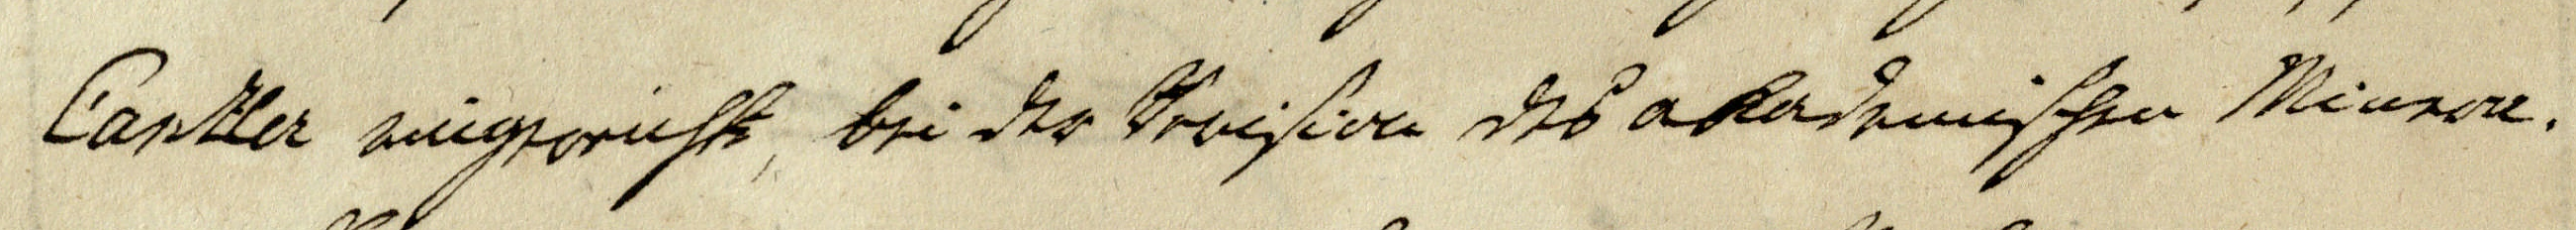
Canzler eingereichte bei der Revision des akademischen Minera¬
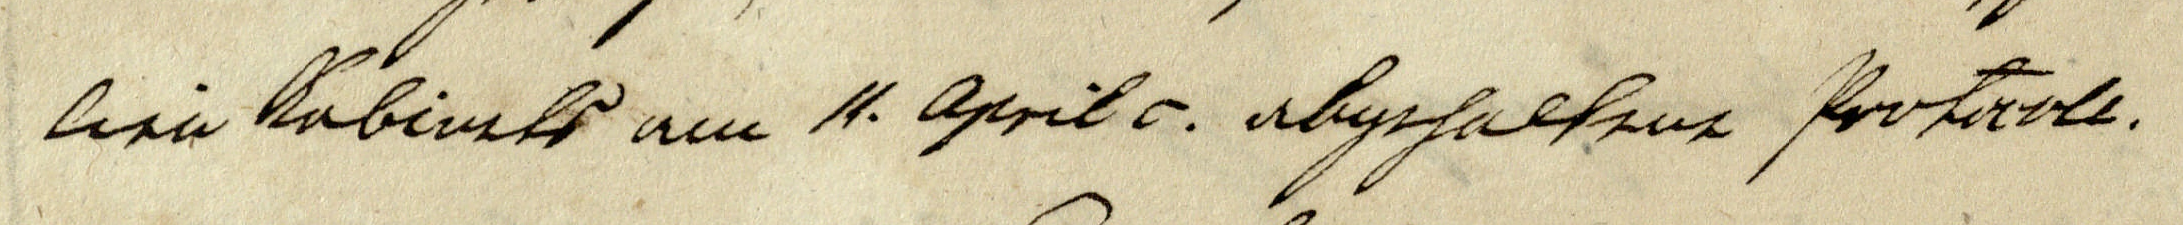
lien Kabinets am 11. April c. abgehaltene Protocoll.
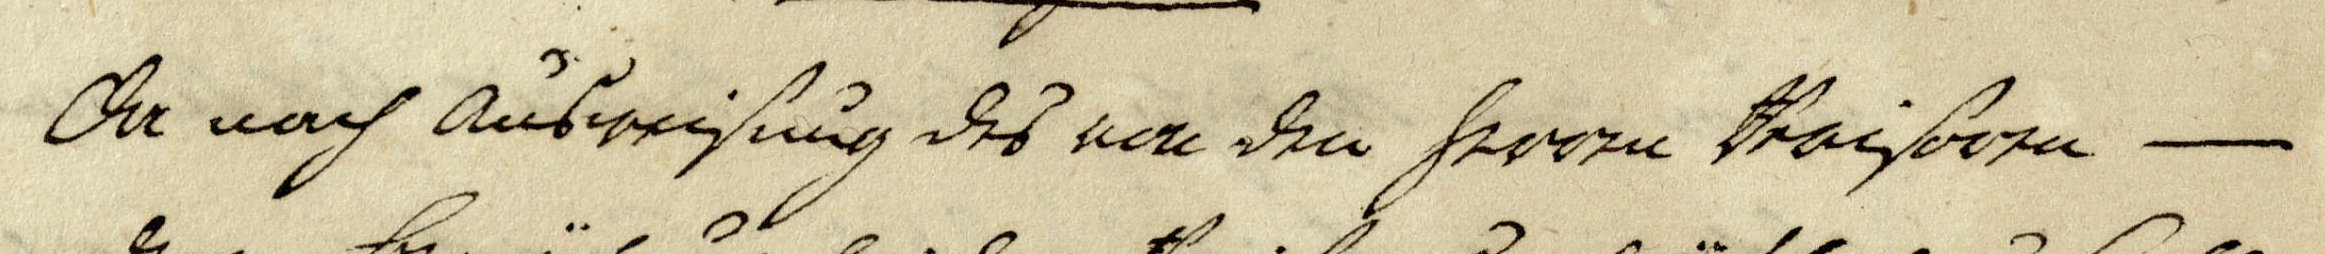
Da nach Ausweisung des von den Herren Revisoren
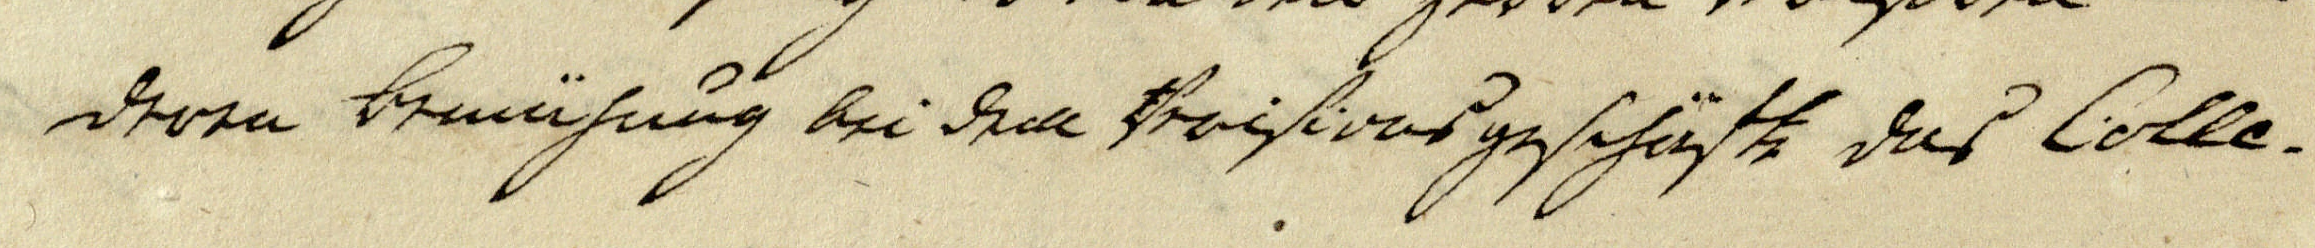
deren Bemühung bei dem Revisionsgeschäfte das Colle¬
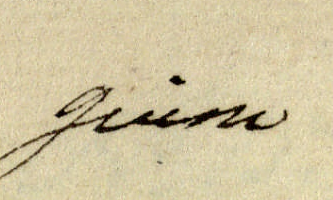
gium
